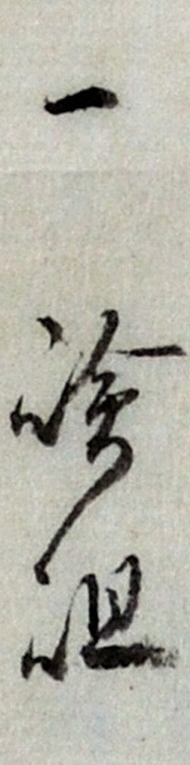一嶮岨
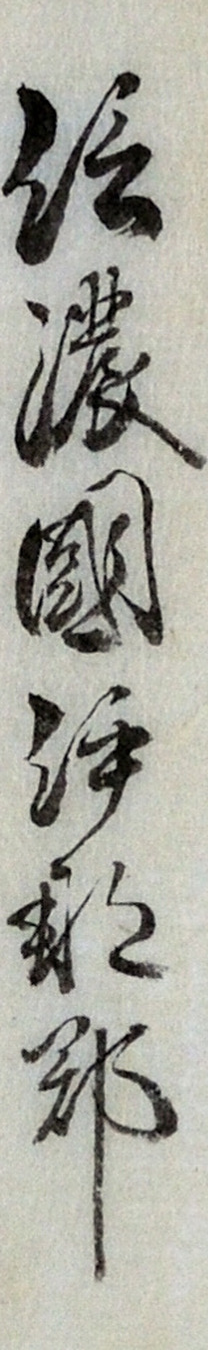信濃国伊那郡
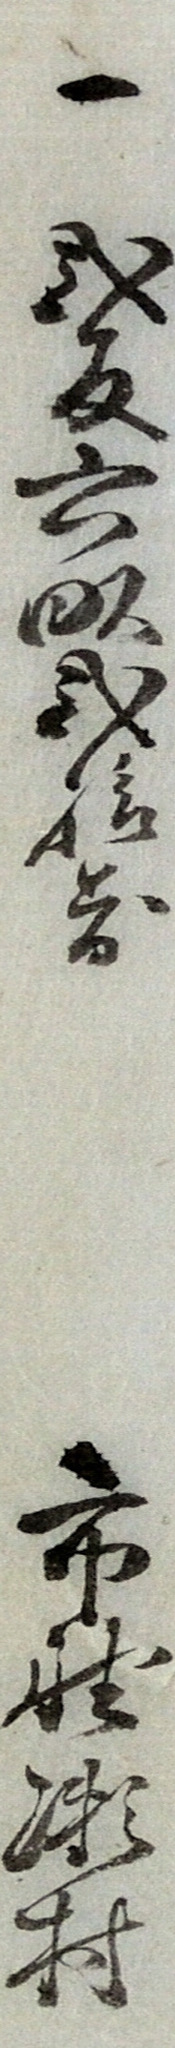一弐反六㽗弐拾歩市野瀬村
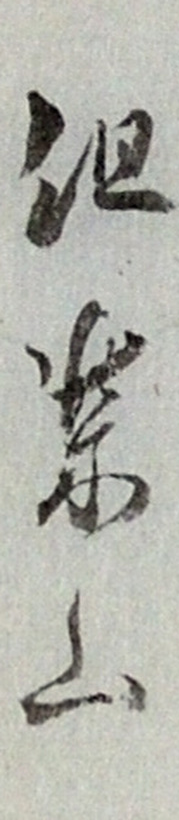但柴山

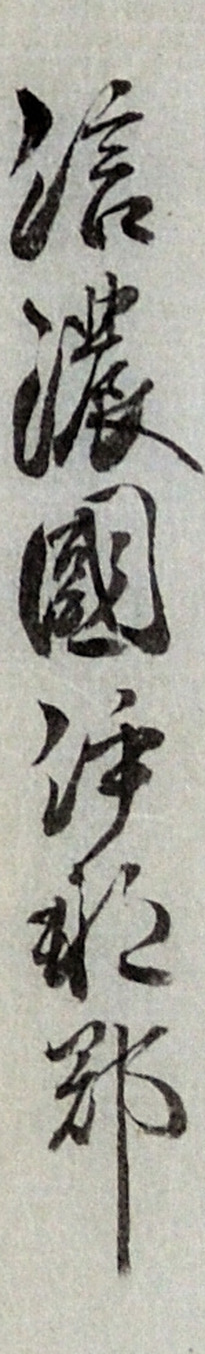信濃国伊那郡
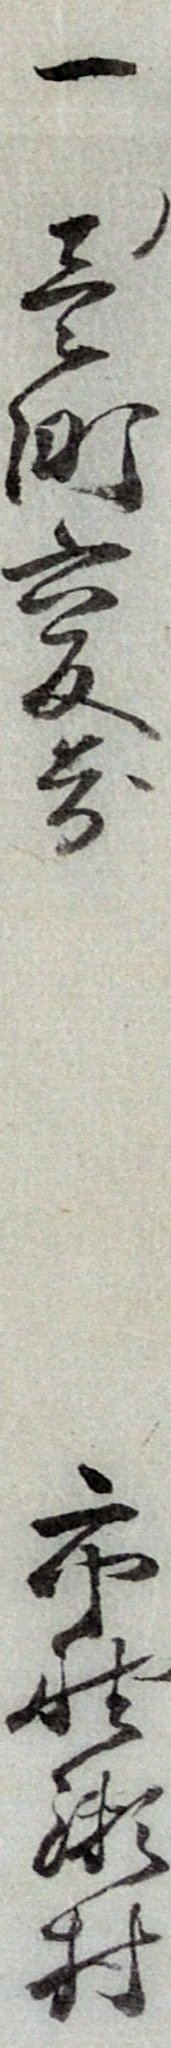一壱町六反歩市野瀬村
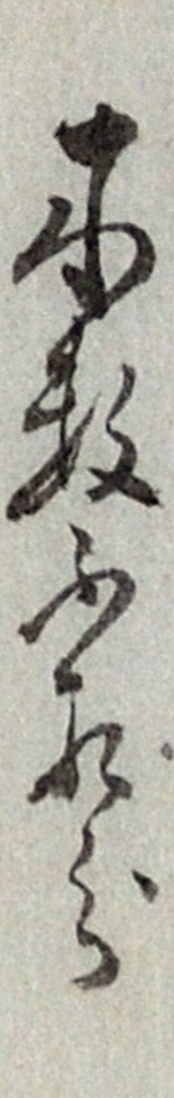木数不相分
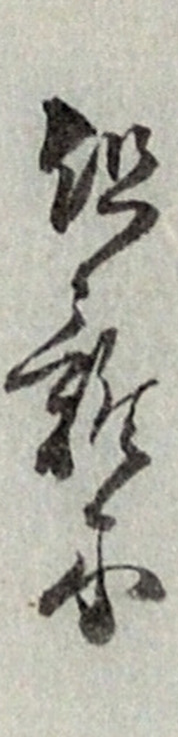但雑木
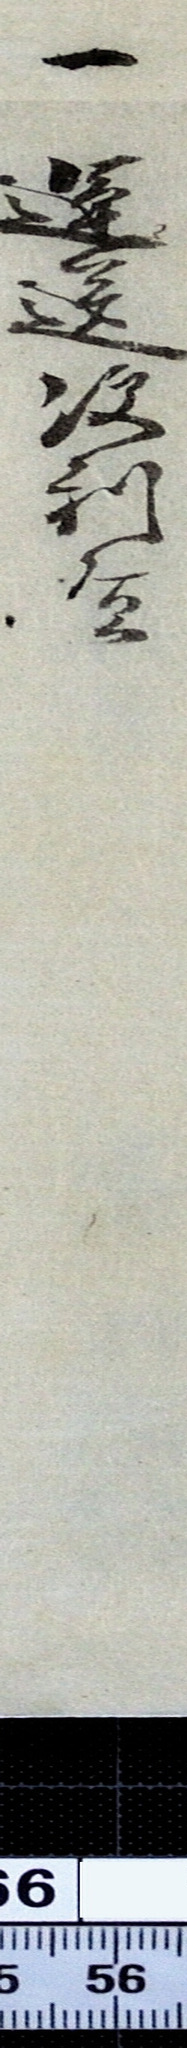一運送便利宜
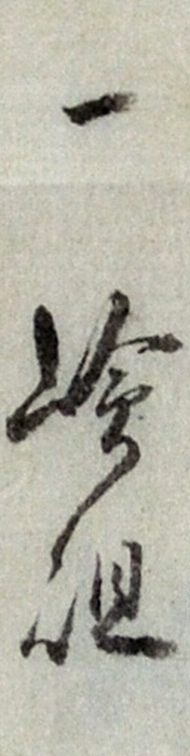一嶮岨
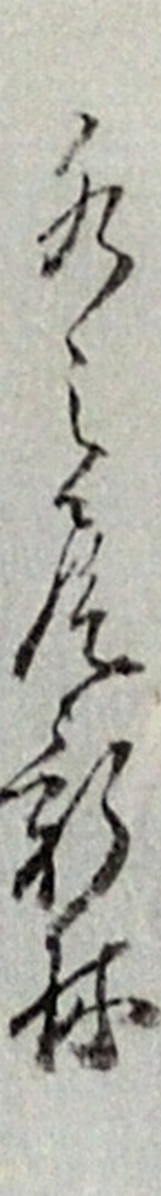水之尾新林
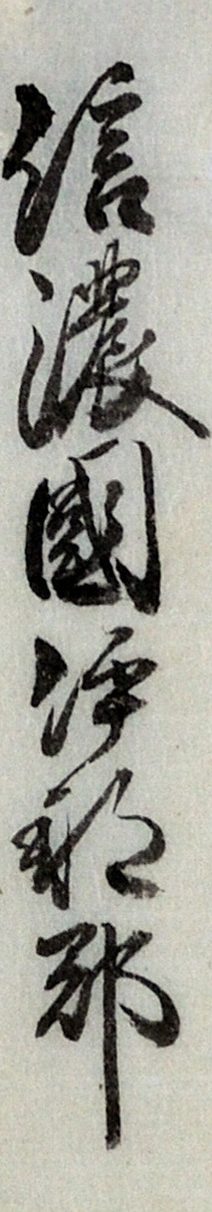信濃国伊那郡
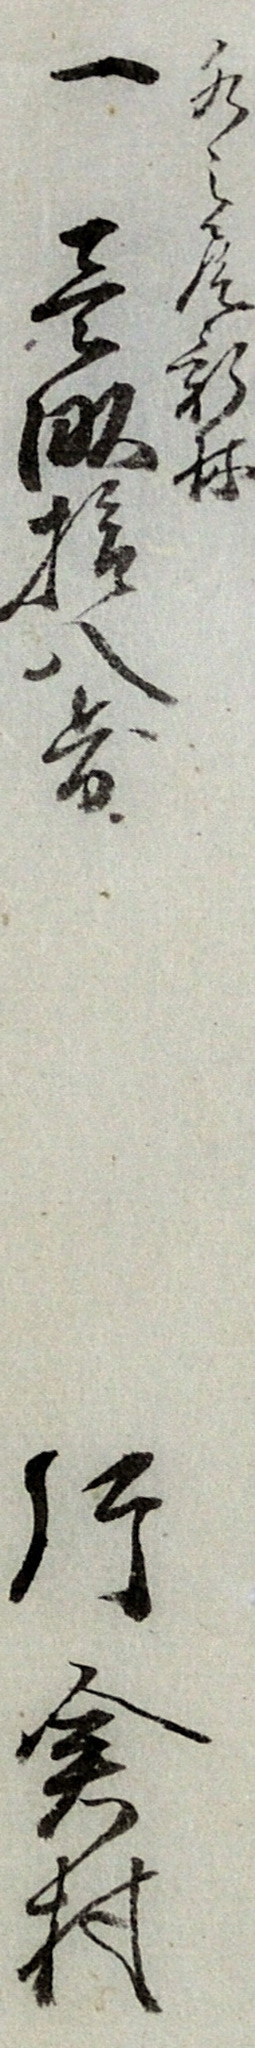一壱㽗拾八歩片倉村
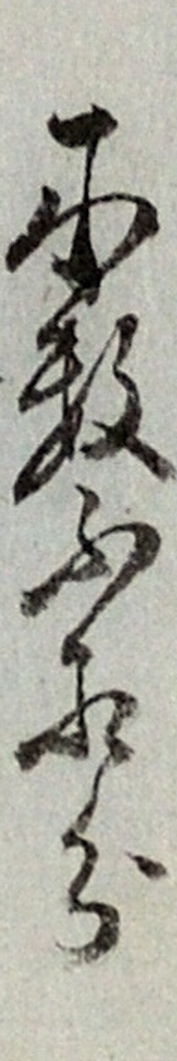木数不相分
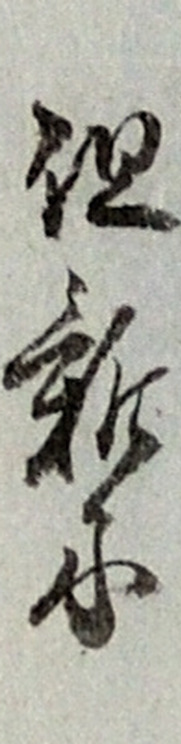但雑木
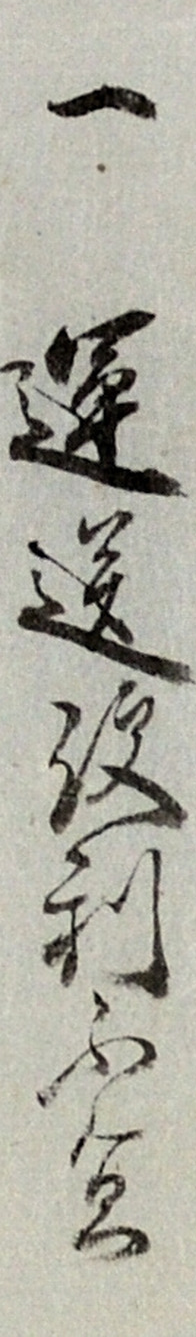一運送便利不宜
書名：官林反別帳
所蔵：伊那市立高遠町図書館・合同会社AMANE
